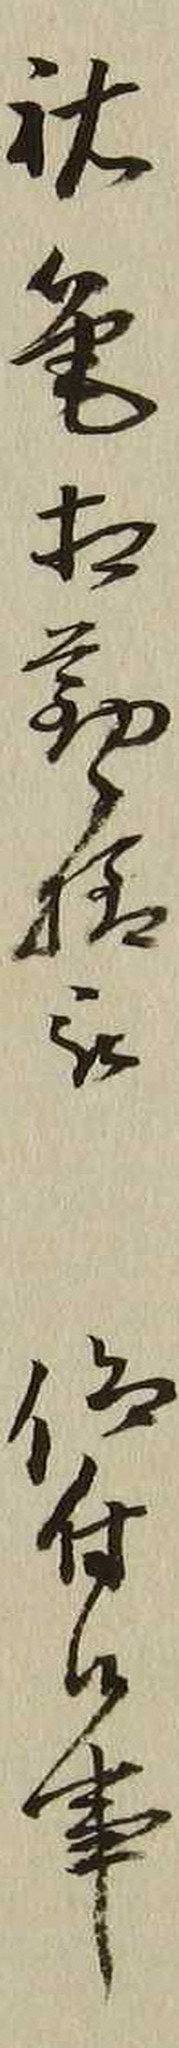祐筆相勤候様被仰付候事
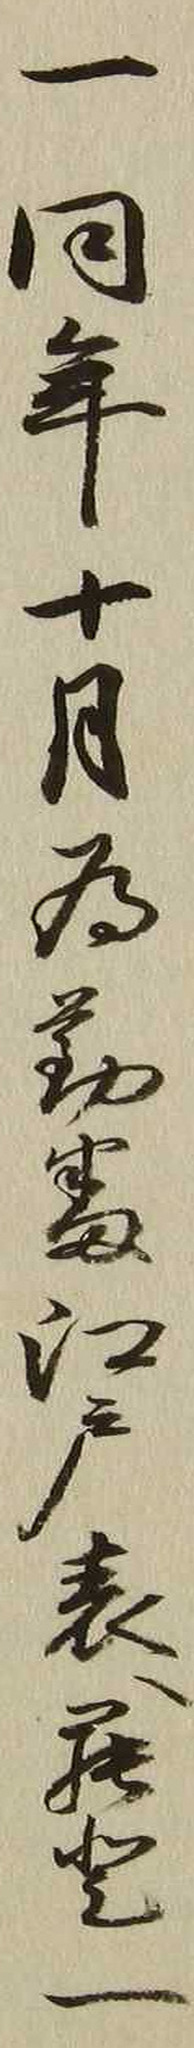一同年十月為勤番江戸表へ罷登一
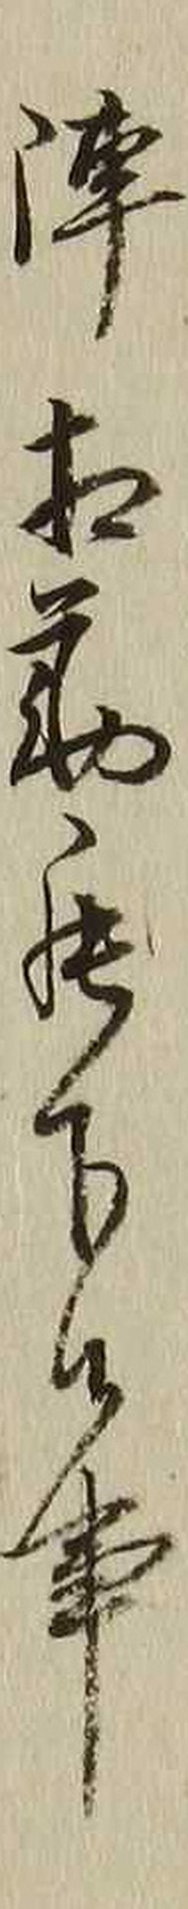陣相勤罷下候事
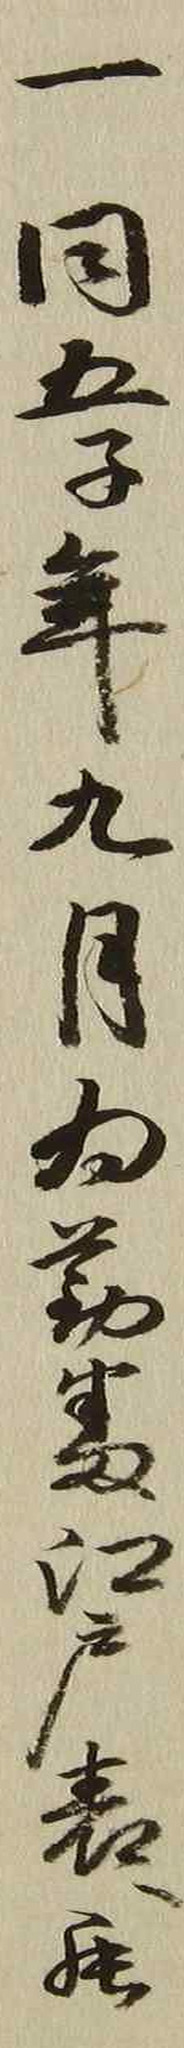一同五子年九月為勤番江戸表へ罷
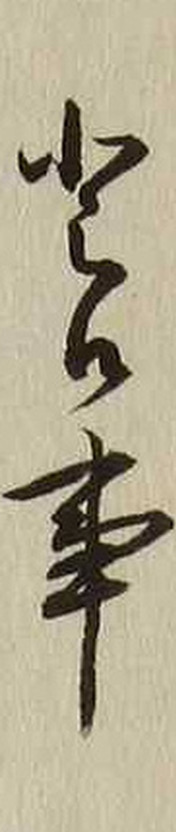登候事
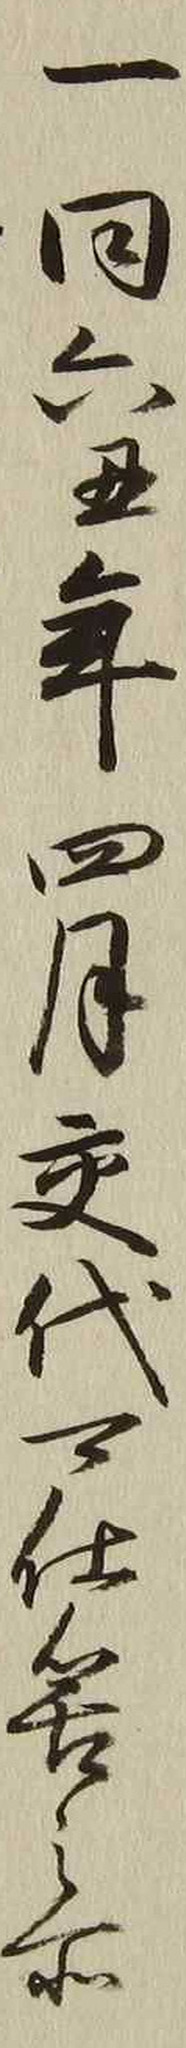一同六丑年四月交代可仕筈之所
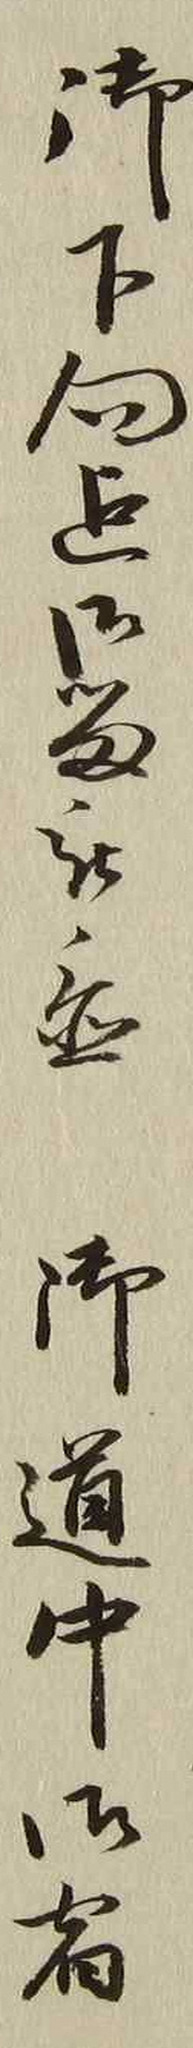御下向迄御留被置御道中御宿
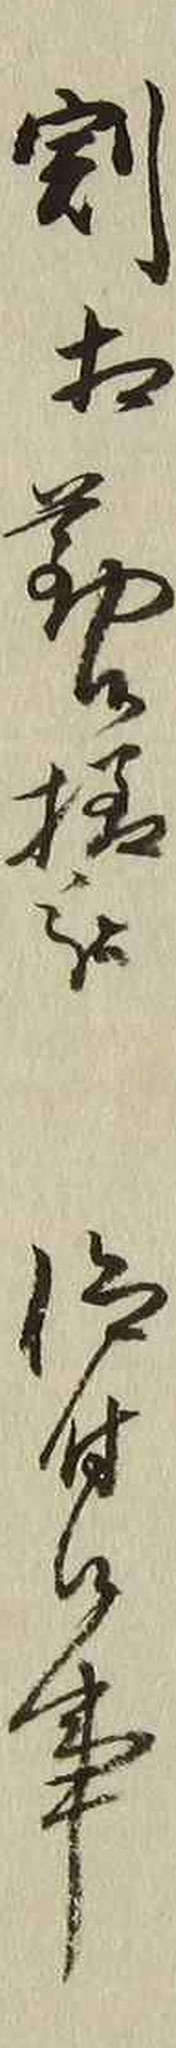割相勤候様被仰付候事
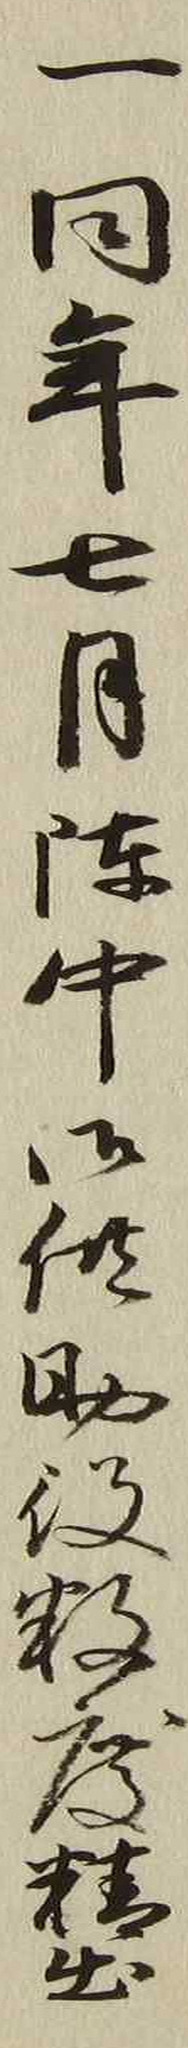一同年七月陣中御供助役数度精出
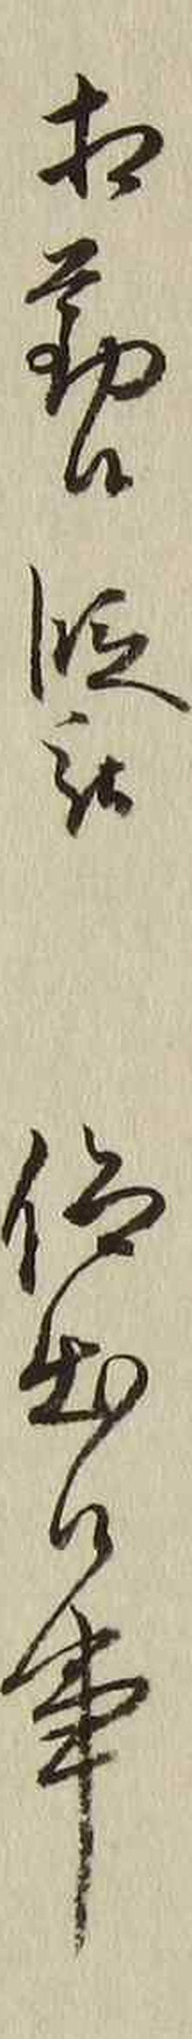相勤候段被仰出候事
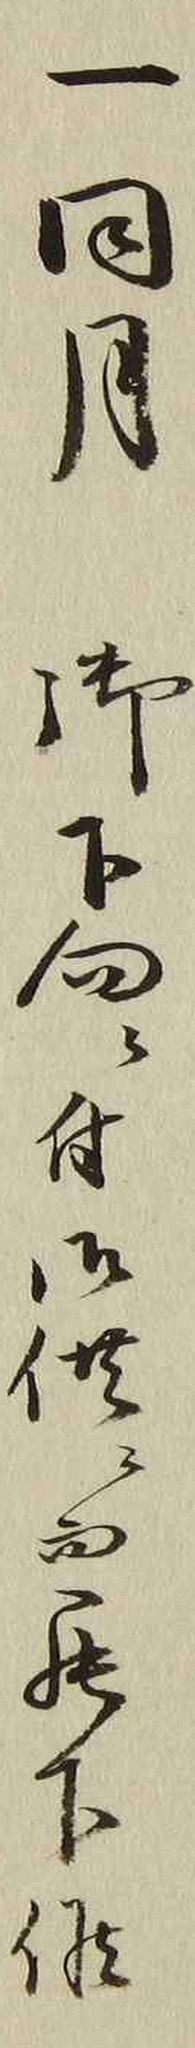一同月御下向ニ付御供ニ而罷下候
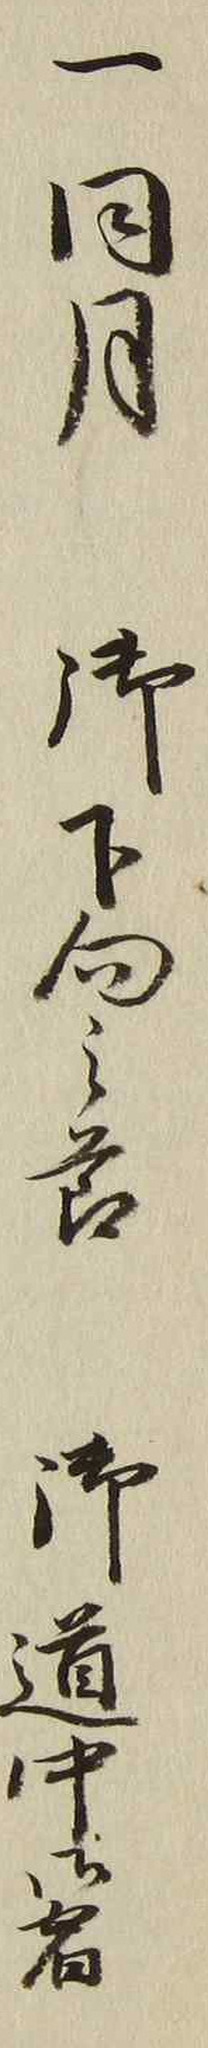一同月御下向之節御道中御宿
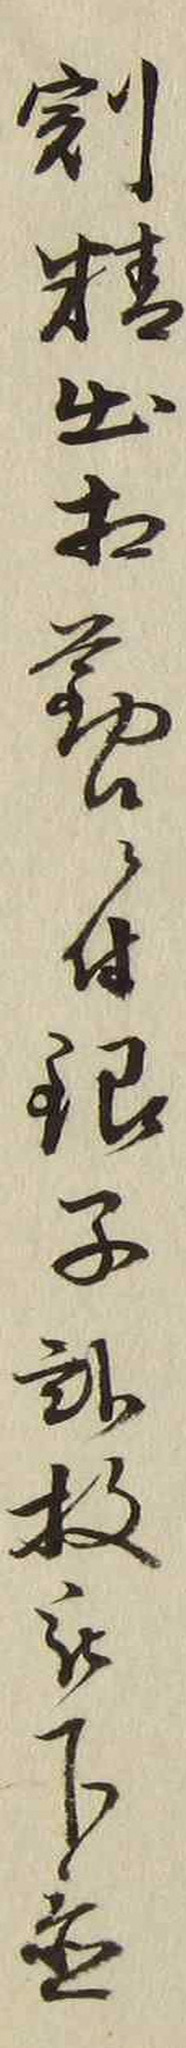割精出相勤候ニ付銀子弐枚被下置

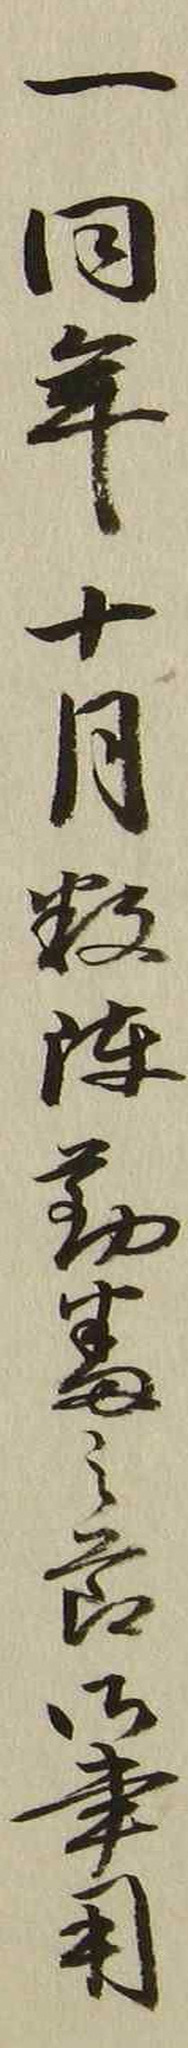一同年十月数陣勤番之節御書用
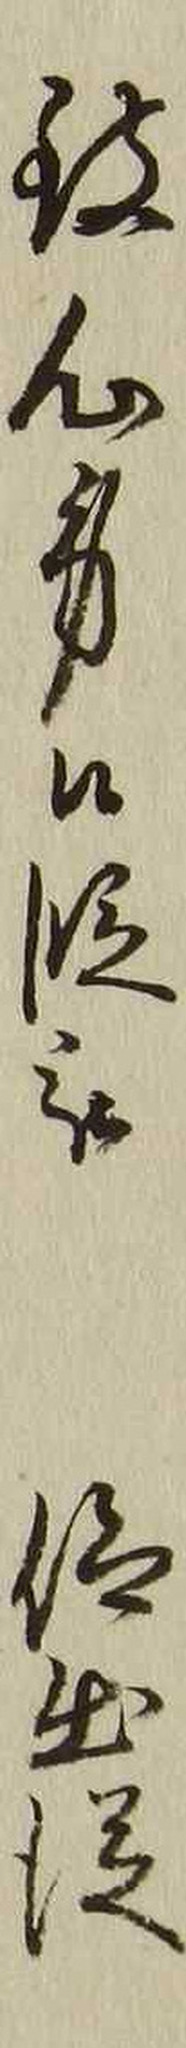致心労候段被仰出従
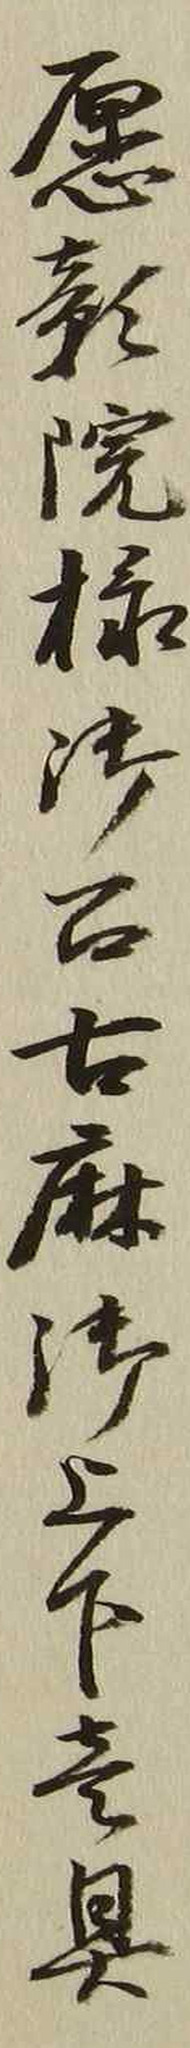愿彰院様御召古麻御上下壱具
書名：諸士系譜　巻之61　と之部4
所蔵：会津若松市立会津図書館
